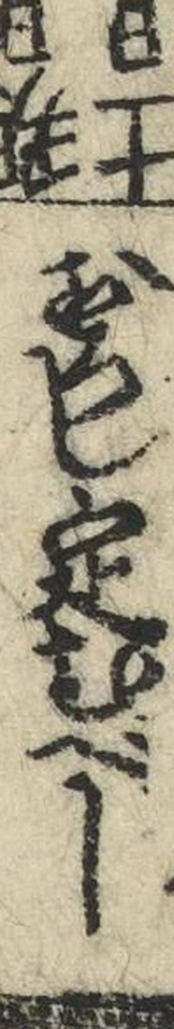おろし定むべし
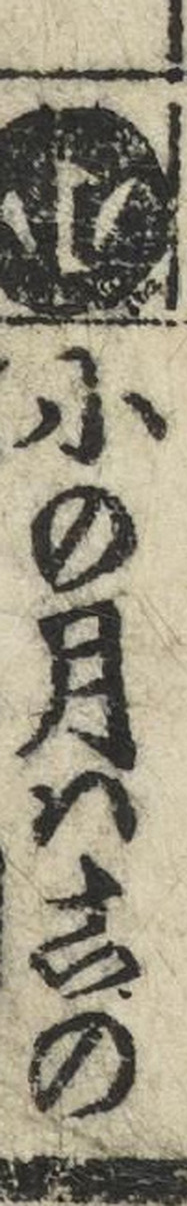小の月はこの
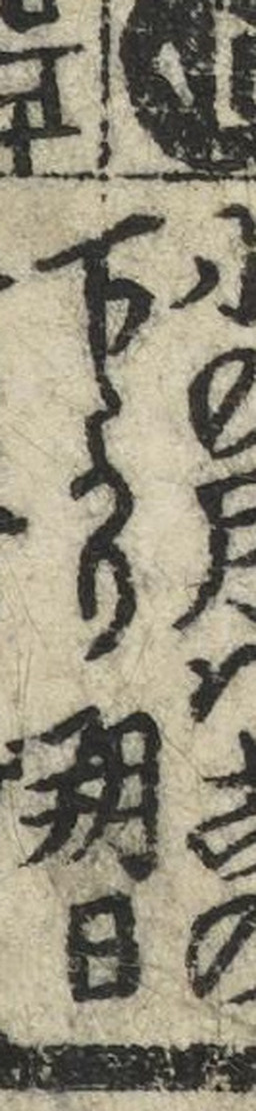下より朔日
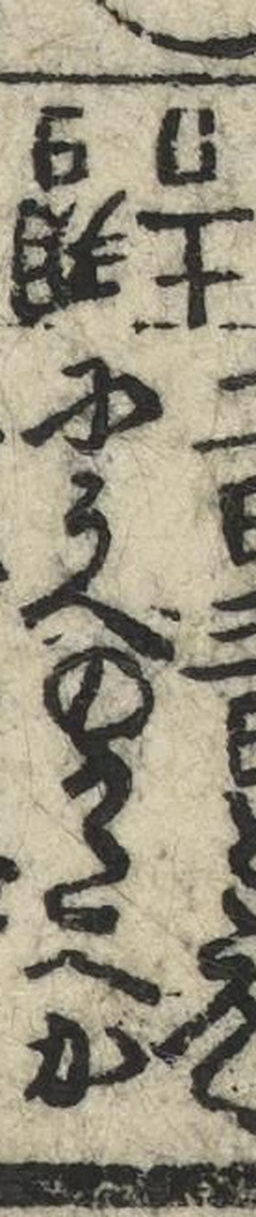にうへのかたへか
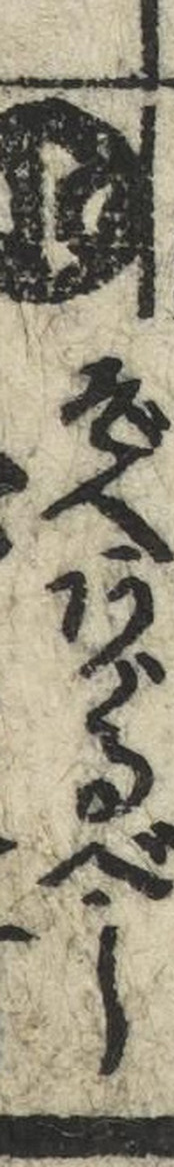ぞへあかるべし
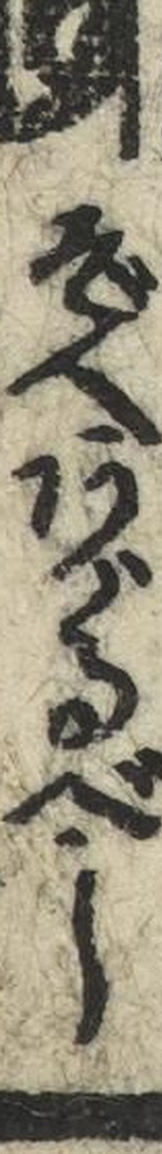ぞへあかるべし
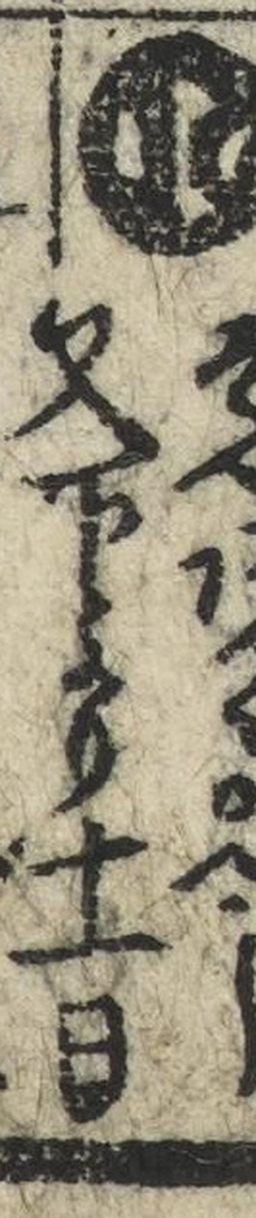又下より十一日
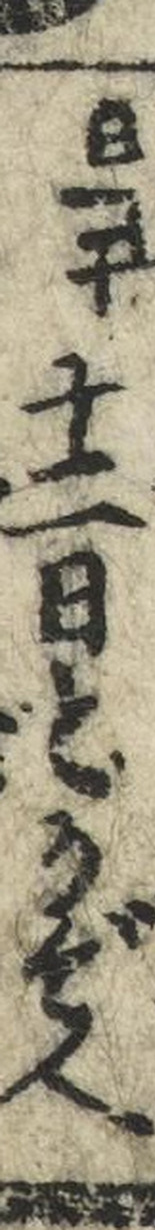十二日とかぞへ
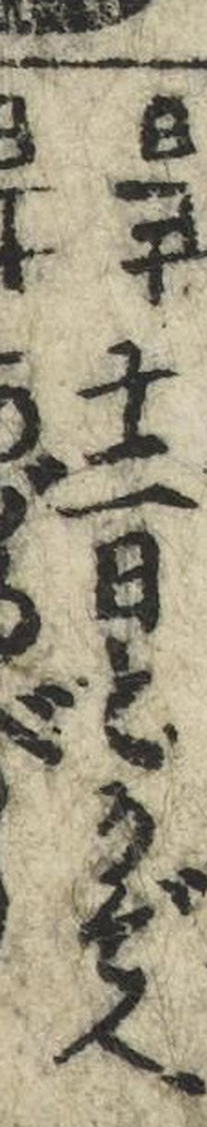十二日とかぞへ
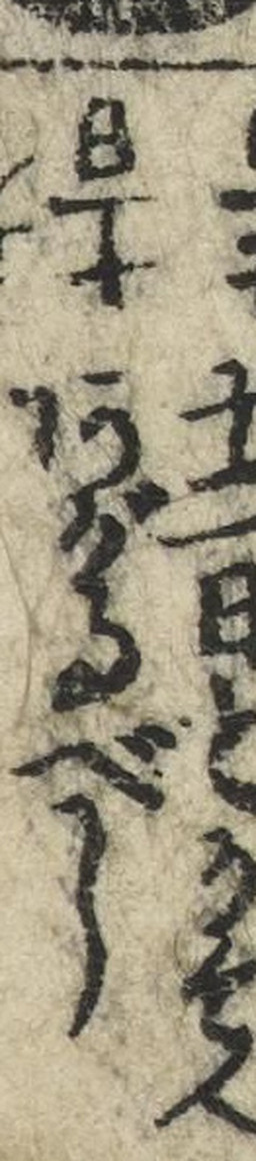あがるべし

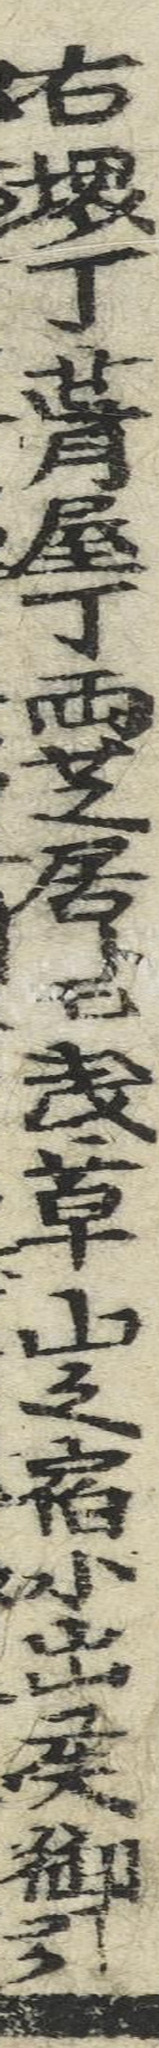右堺丁葺屋丁両芝居トモ浅草山之宿小出侯御引
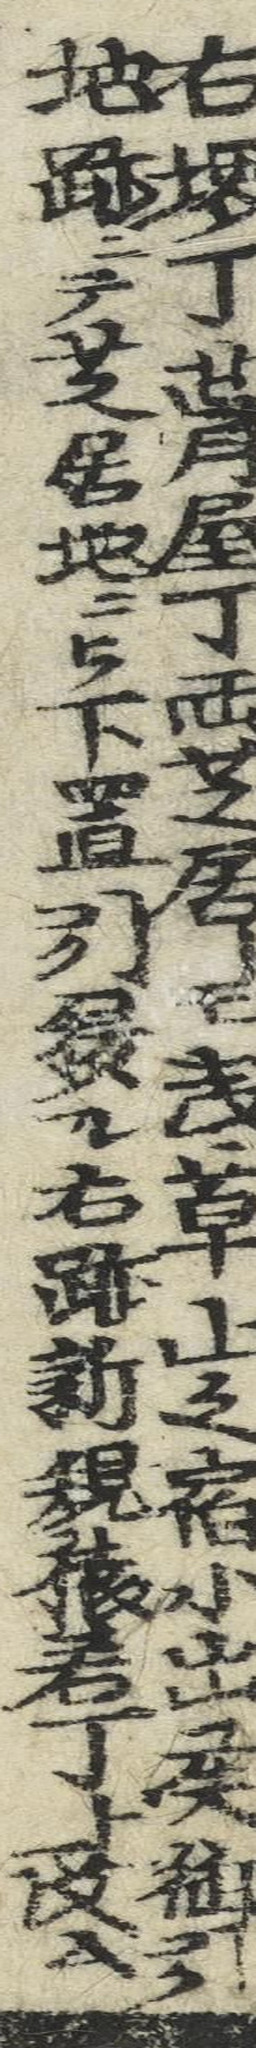地跡ニテ芝居地ニ被下置引移ル右跡新規猿若丁ト改ム
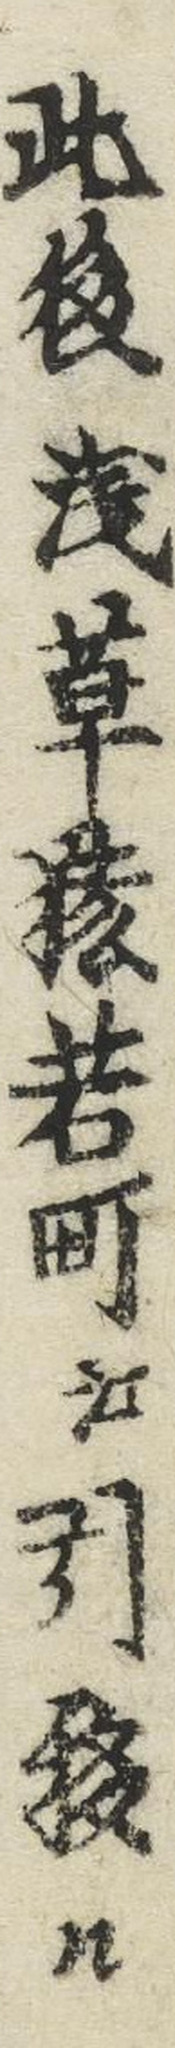此後浅草猿若町江引移ル
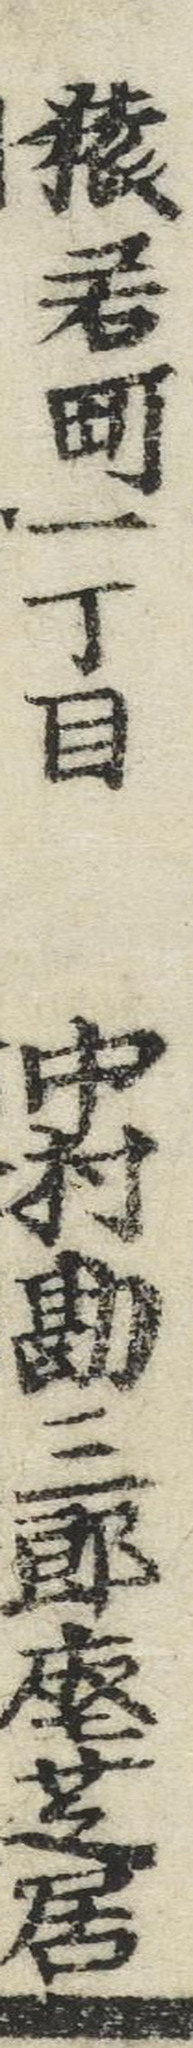猿若町一丁目中村勘三郎座芝居
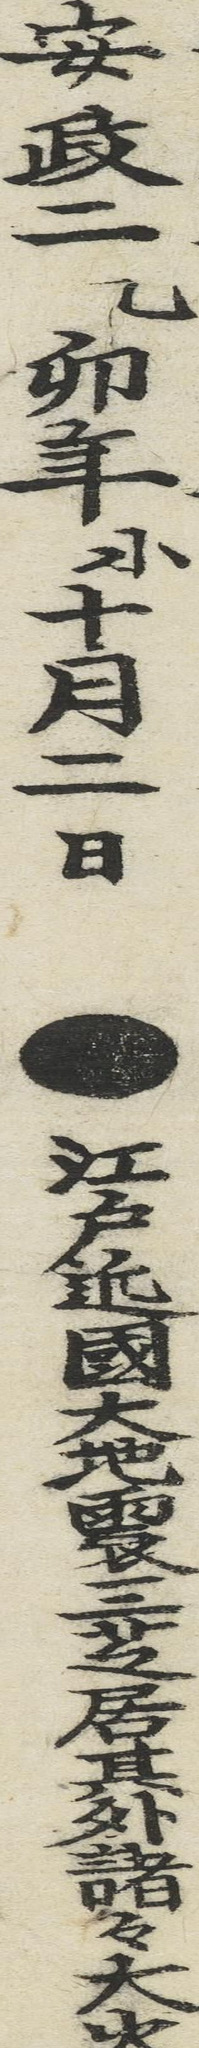安政二乙卯年小十月二日●江戸近国大地震三芝居其外諸々大火
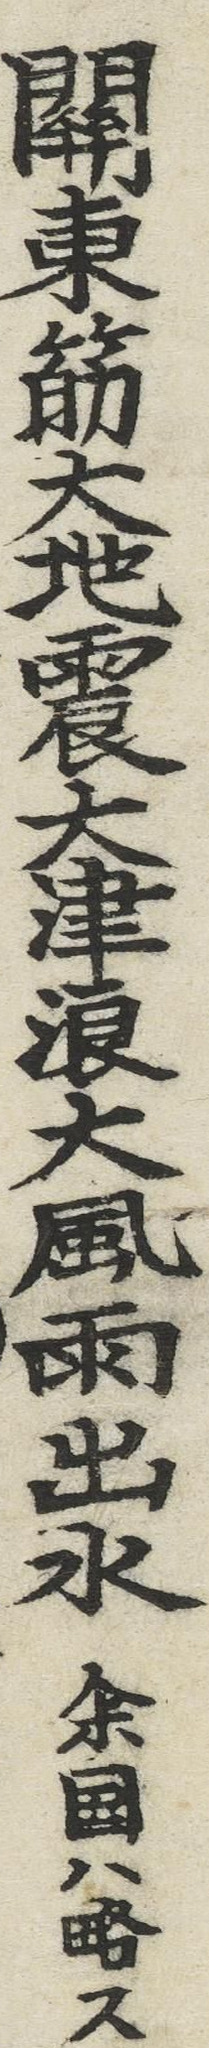関東筋大地震大津波大風雨出水余国ハ略ス
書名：非常日用記
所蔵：東京大学地震研究所図書室 Earthquake Research Institute Library, The University of Tokyo, JAPAN
